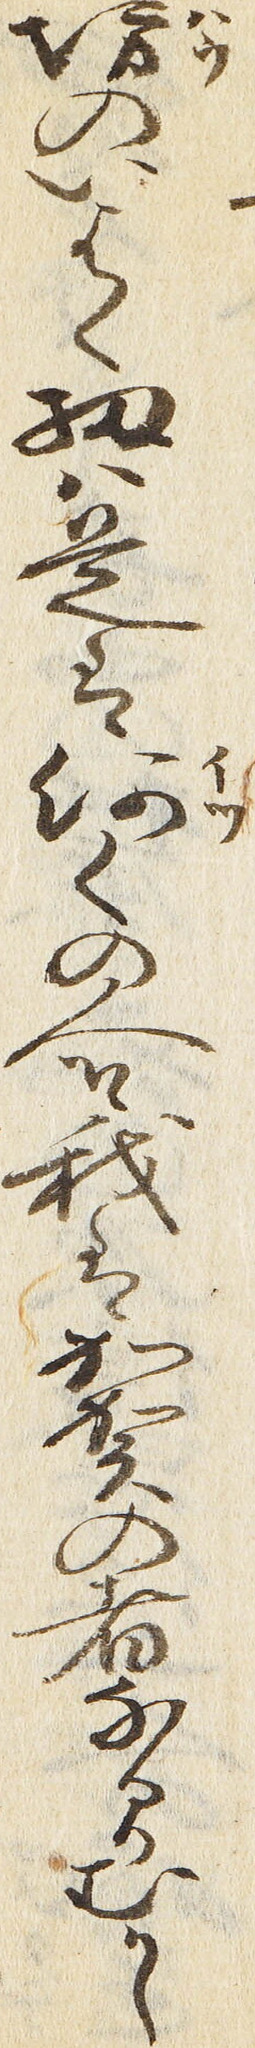坊のいはく扨は是は何くの人そ我は加賀の者なるかむかし
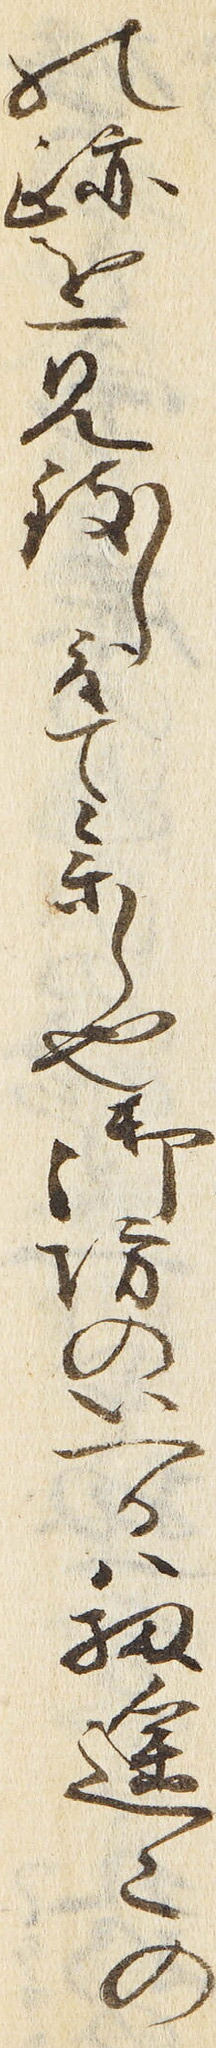の跡を一見致し度て参し也御坊のいへるは扨遥々の
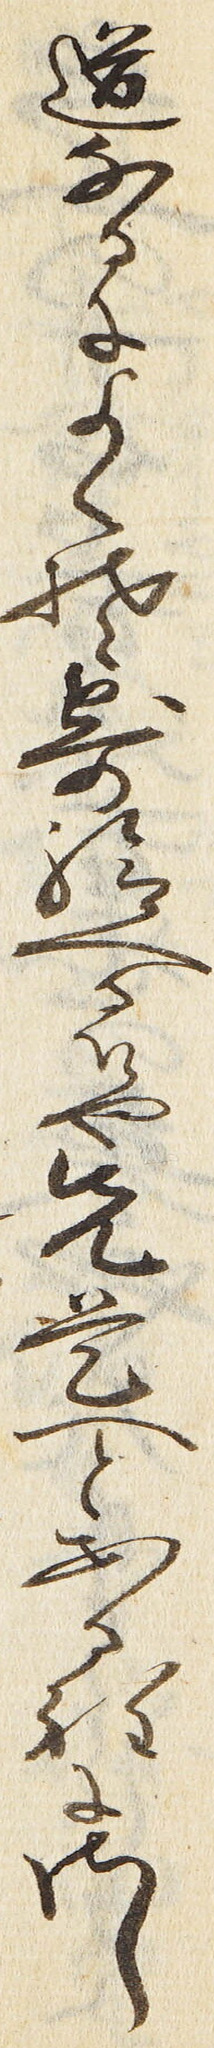道なるによくそ寄給へるそや先是へとある程にさし
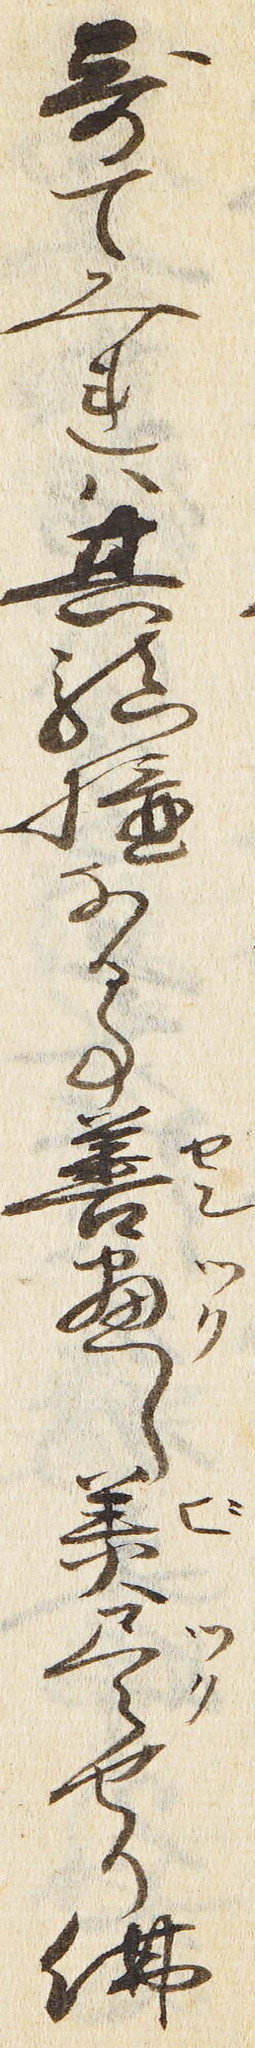寄てみれは其結構なる事善尽し美尽せり仏
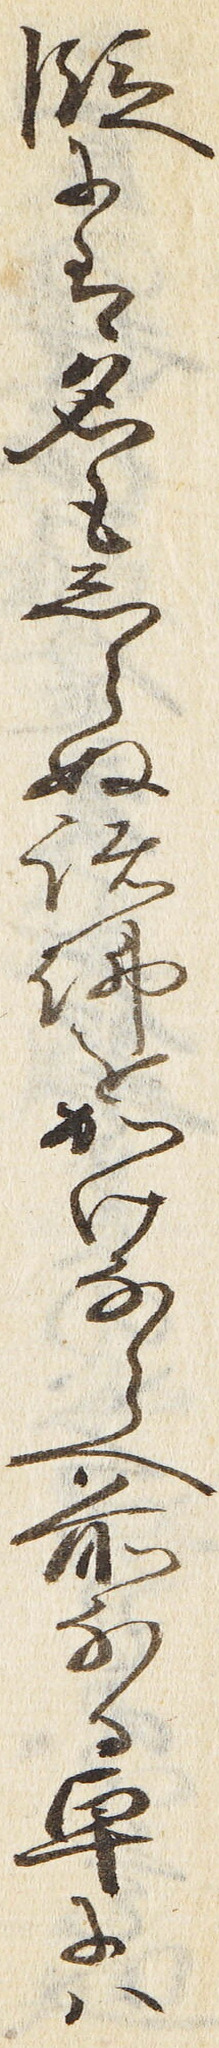段には名もしらぬ諸仏をかけならへ前なる卓には
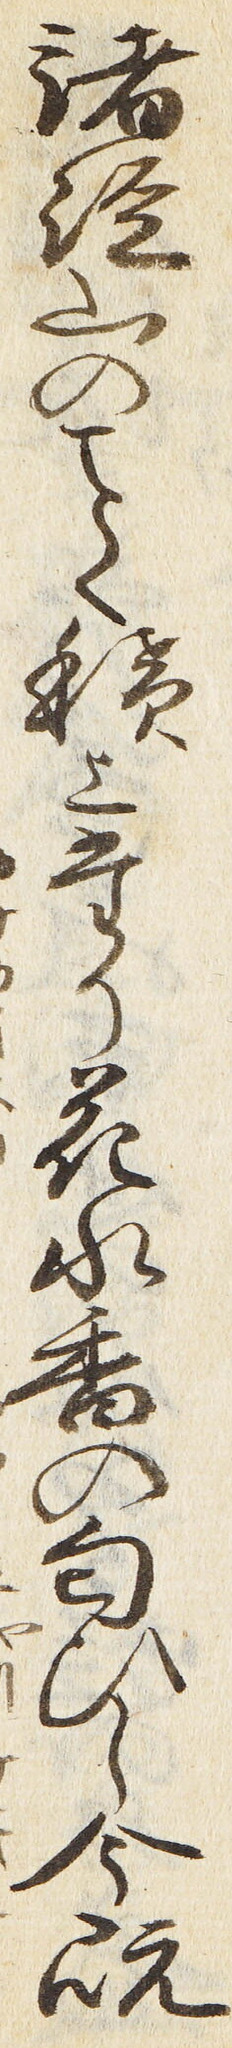諸経山のことく積上たり花水香の匂ひし今既
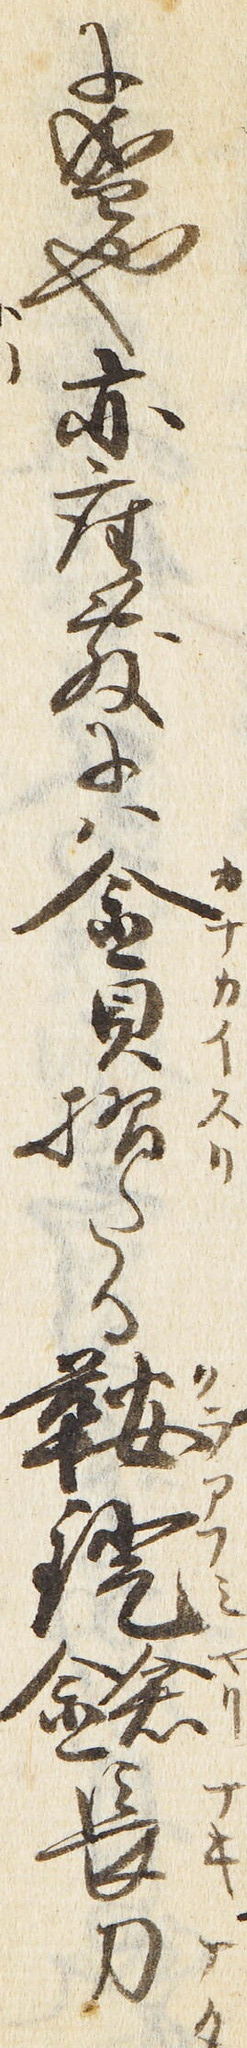に盛也亦座敷には金貝摺たる鞍鐙鎗長刀
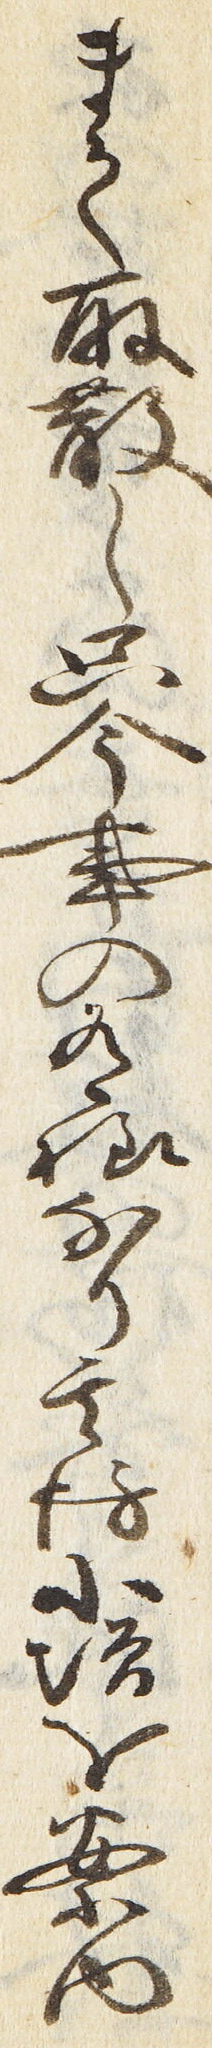まて取散し只今事の有様なり其後小僧を案内
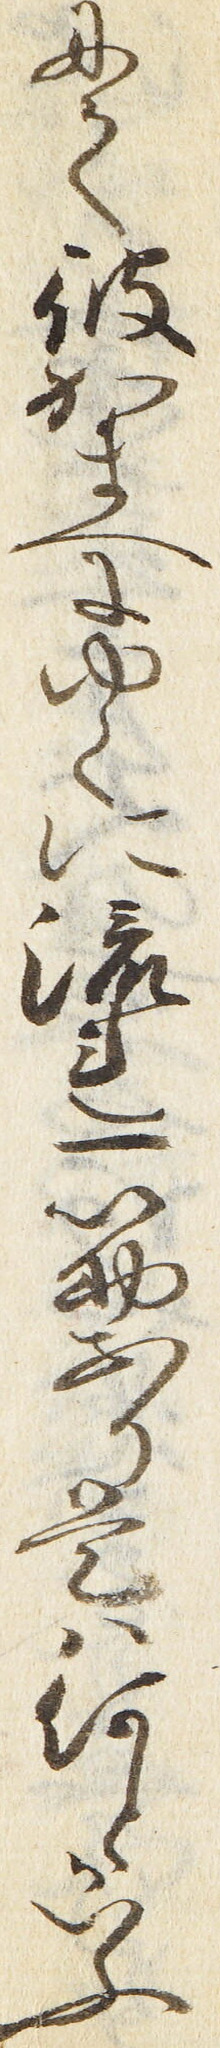にて彼かまへにゆくに流れ一筋なり是は何とかいふ
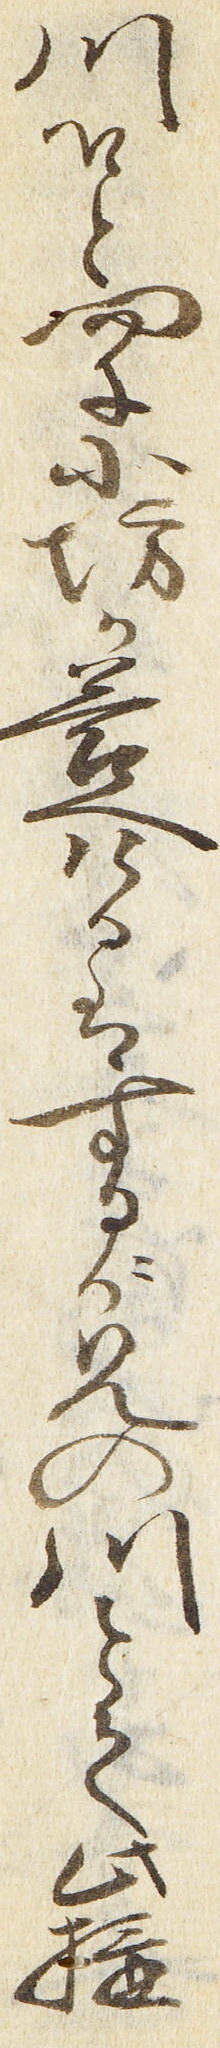川そと問に小坊か答へけるはするが見の川とて此構
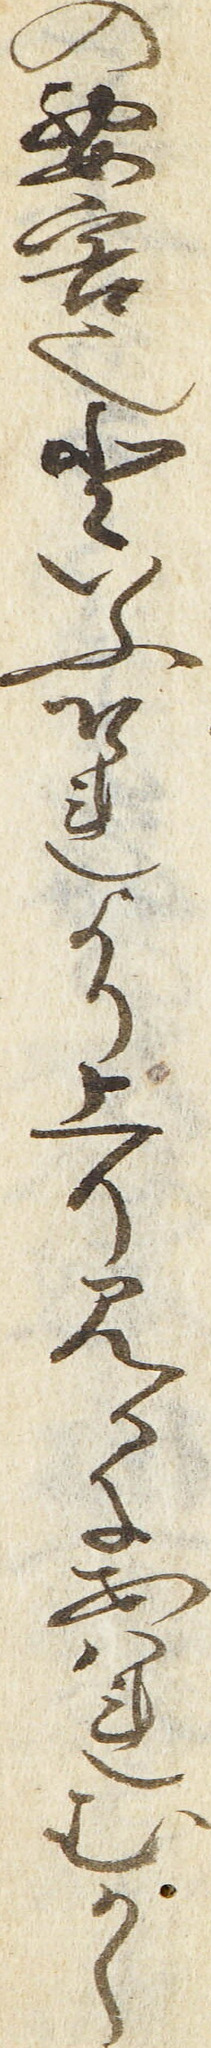の要害也といふそれより上り見るにあはれむかし

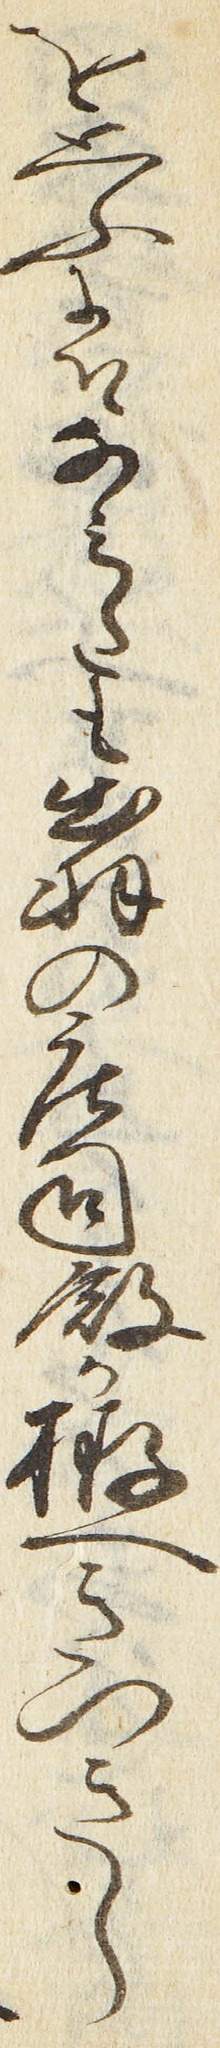を思ふにそなみたも出羽の庄司殿か拵へきつきし
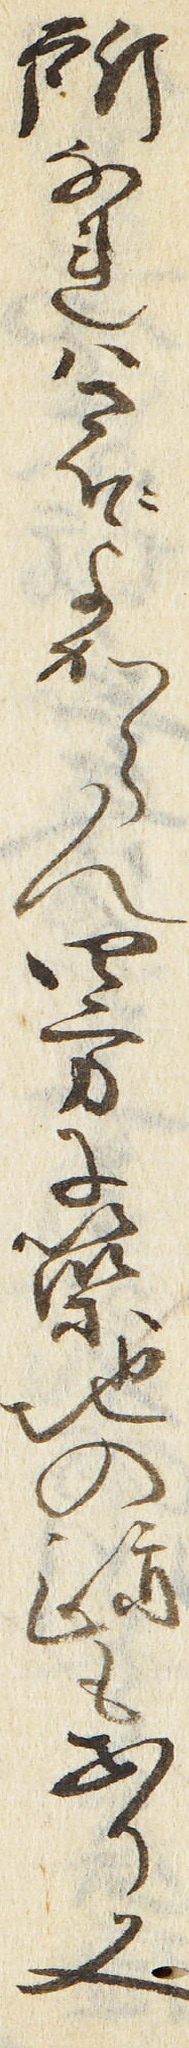所なれはさぞよからん四方に築地の跡もあり又
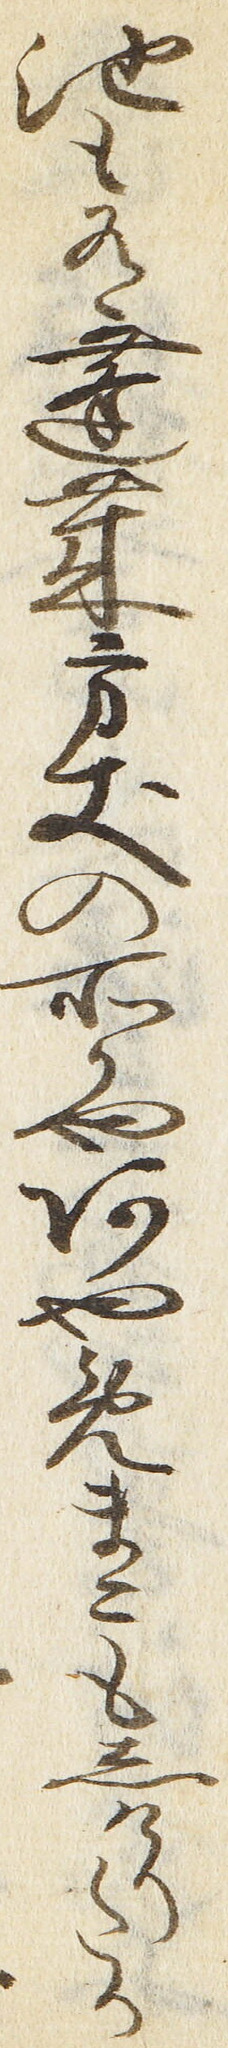池も有蓬莱方丈の所かやあやめまこもしけりたり
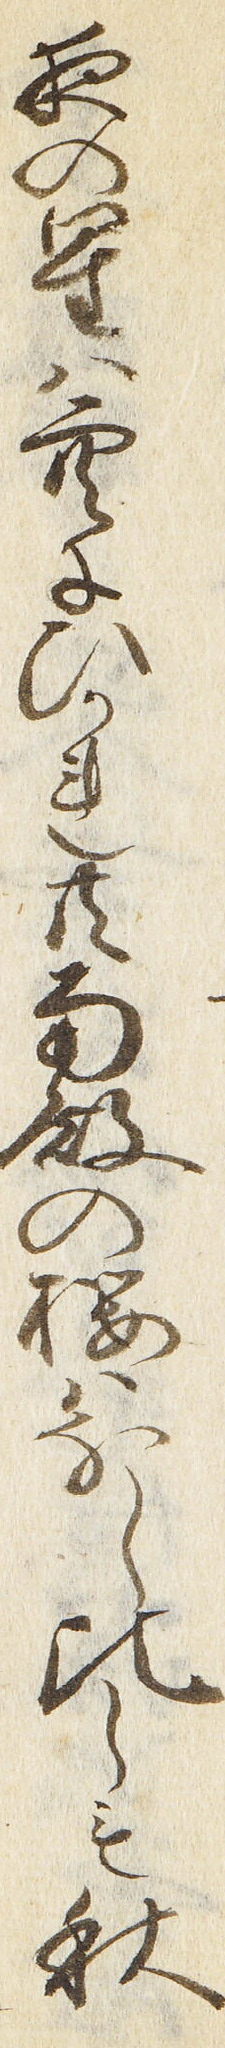夜の星は空にひかれ共南殿の桜はなし比しも秋
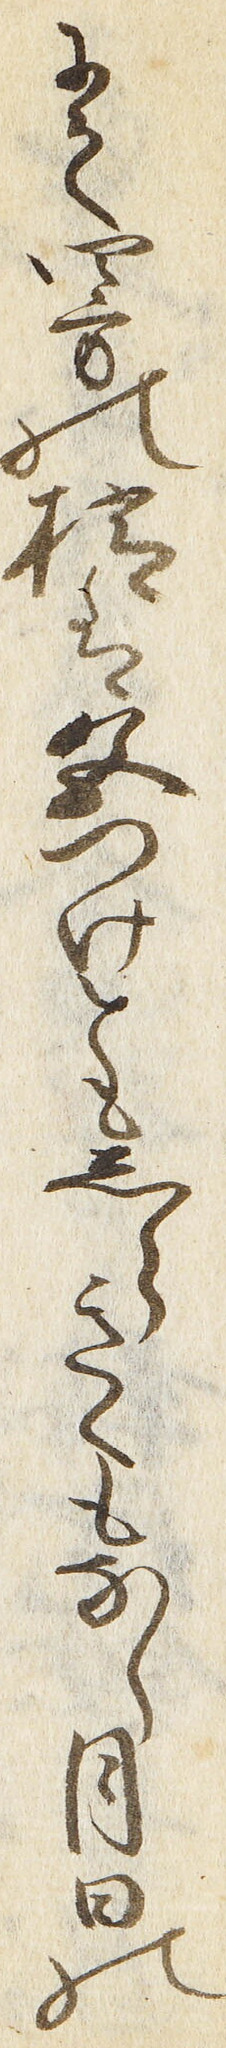にて四方の梢は色つけともしらきくもなし月日の
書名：海陸世話日記
